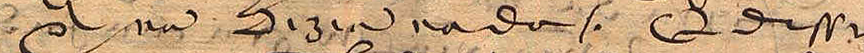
e nā Diziā nada /. E disse
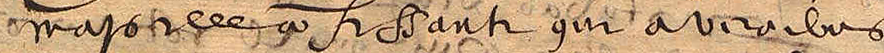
majs elle cōfessāte que avera dous
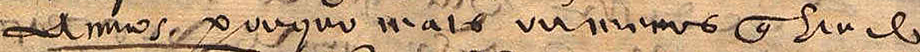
annos pouquo mais ou menos q̄ hindo
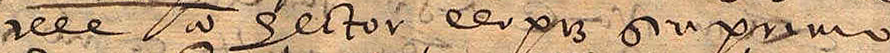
elle cō hector llopez seu primo
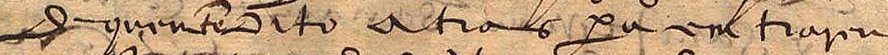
de quem tē dito atras ꝑa emtraren
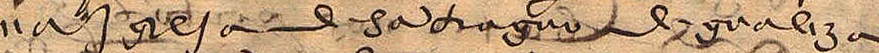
na Jgreja de sātiaguo de gualiza
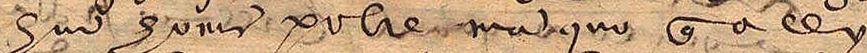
huū homē pobre māquo q̄ ally
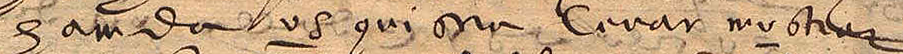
hamda os quisera leuar mostrar
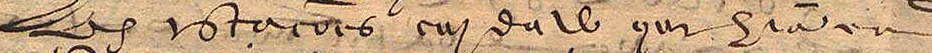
as estações cujdādo que hiā en
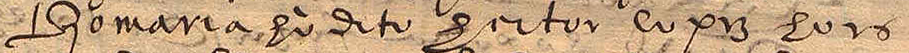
Romaria hò dito heitor lopez ho es
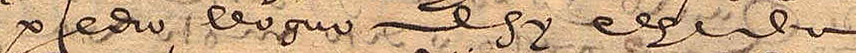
pedio lloguo de sy e lhe deu
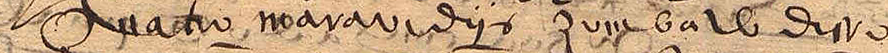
Quatro maravidijs zombādo disso
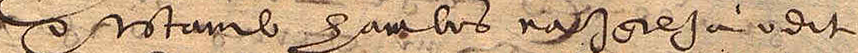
e estamdo hambos na JgreJa o dito
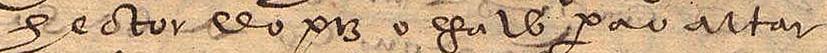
hector llopiz olhādo ꝑa o altar
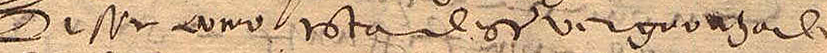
Disse como esta desēverguonhado
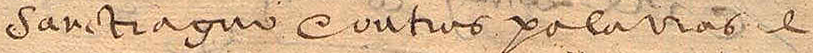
Sanctiaguo e outras palavras de
